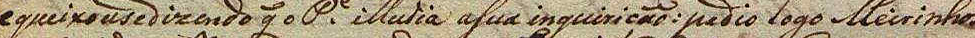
e queixouse dizendo q̄ o P.e illudia a sua inquirição padio logo Meirinhos
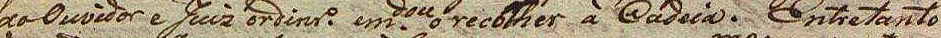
ao Ouvidor e Juiz ordinr.o e m.dou o recolher à Cadeia. Entretanto
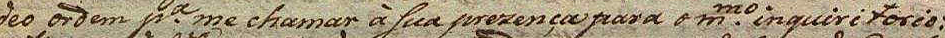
deo ordem p.a me chamar à sua prezença para o mmo. inquiritorio:
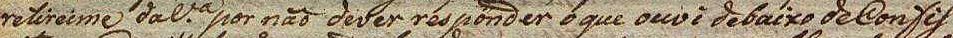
retireime da V.a por não dever responder o que ouvi debaixo de Confis
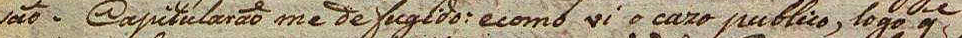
são - Capitularâo me de fugido: e como vi o cazo publico, logo q̄
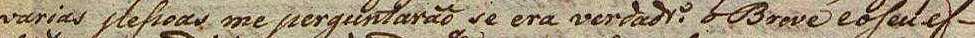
varias pessoas me perguntarão se era verdadr.o o Breve e o seu ef
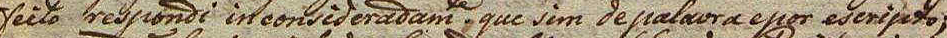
feito respondi inconsideradamte. que sim de palavra e por escripto;
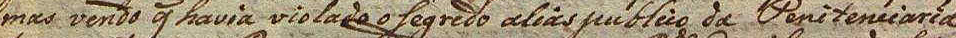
mas vendo q̄ havia violado o segredo alias publico da Penitenciaria,
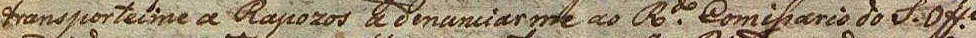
transporteime a Rapozos a denunciarme ao R.do Comissario do S. Off.o
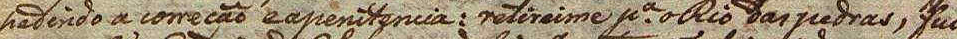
pedindo a correção e a penitencia: retireime p.a o Rio das pedras, fui
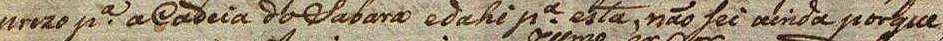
prezo p.a a Cadeia do Sabara e dahi p.a esta, não sei ainda porque,
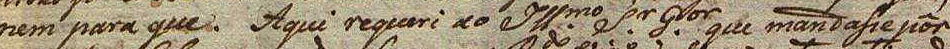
nem para que. Aqui requeri ao Ill.mo S.r G.or que mandasse pôr
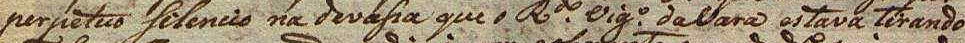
perpetuo silencio na devassa que o Rdo. Vig.o da Vara estava tirando
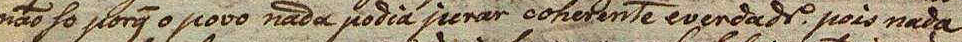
não so porq̄ o povo nada podia jurar coherente e verdadro. pois nada
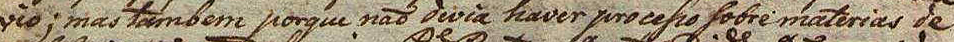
vio; mas tambem porque não devia haver processo sobre materias de
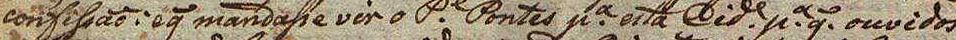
confissão: e q̄ mandasse vir o P.e Pontes p.a esta Cid.e p.a q̄ ouvidos
